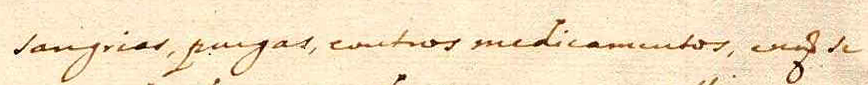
sangrias, purgas, e outros medicamentos, e naõ se
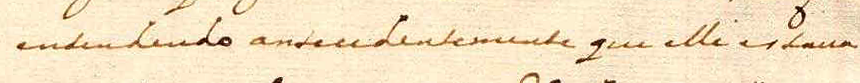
entendendo antecedentemente que elle estaua
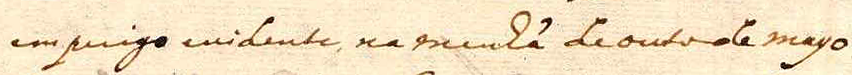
em perigo euidente, na menhã de outo de mayo
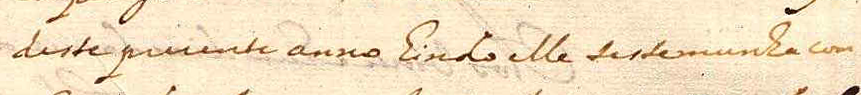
deste prezente anno hindo elle testemunha con
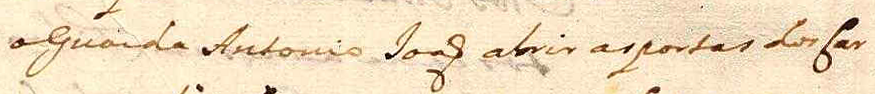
o Guarda Antonio Ioaõ abrir as portas dos Car
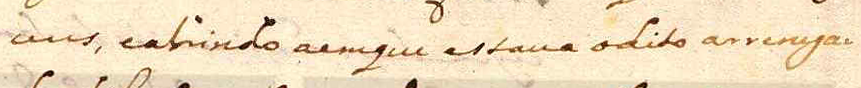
ceres, e abrindo a em que estaua o dito arrenega
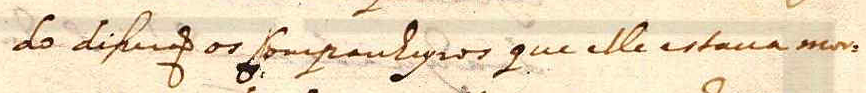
do disseraõ os Companheyros que elle estaua mor
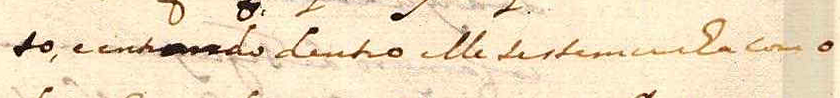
to, e entrando dentro elle testemunha com o
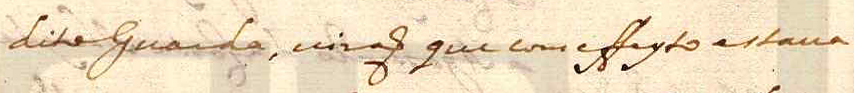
dito Guarda, uiraõ que com effeyto estaua
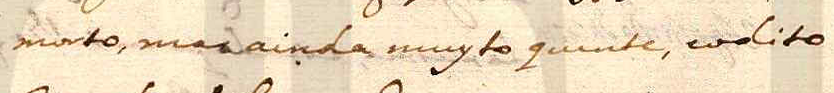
morto, mas ainda muyto quente, e o dito
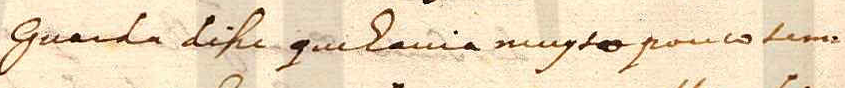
Guarda disse que hauia muyto pouco tem
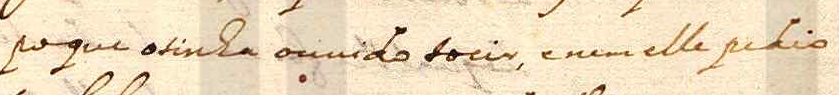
po que o tinha ouuido tocir, e nem elle pedio
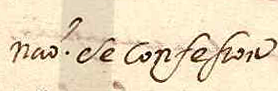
naõ. se confessou
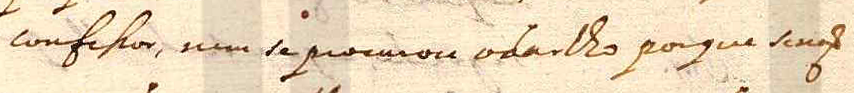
confessor, nem se procurou o darlho porque se naõ
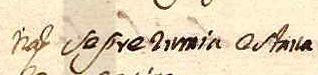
naõ se prezumia estaua
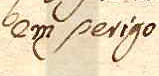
em perigo
